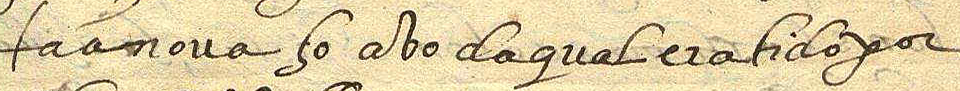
taā noua ho avo da qual era tido por
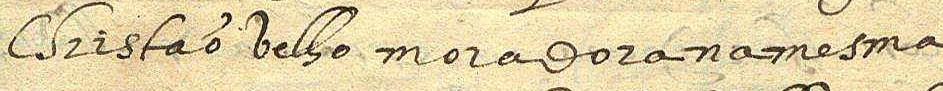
Christaõ velho moradora na mesma
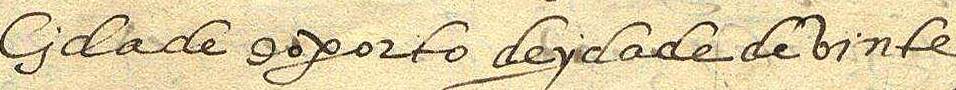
Cjdade do porto de ydade de vinte
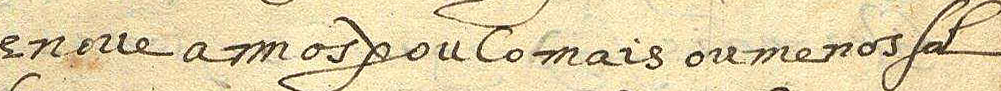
E noue annos pouco mais ou menos soL
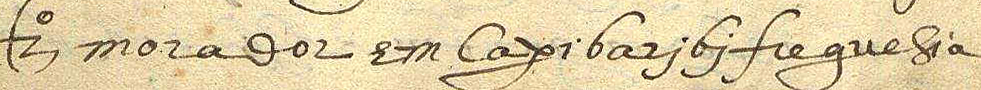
tro morador Em Capibarjbj freguesia
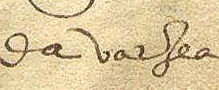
da varzea
